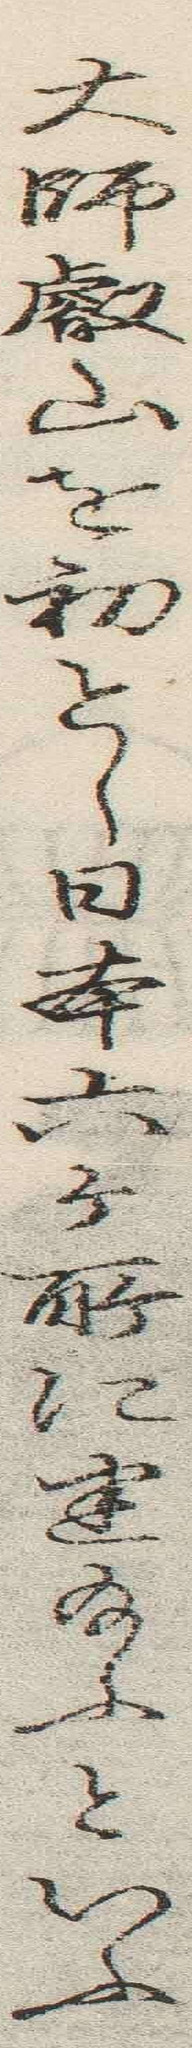大師叡山を初とし日本六ヶ所に建給ふといふ
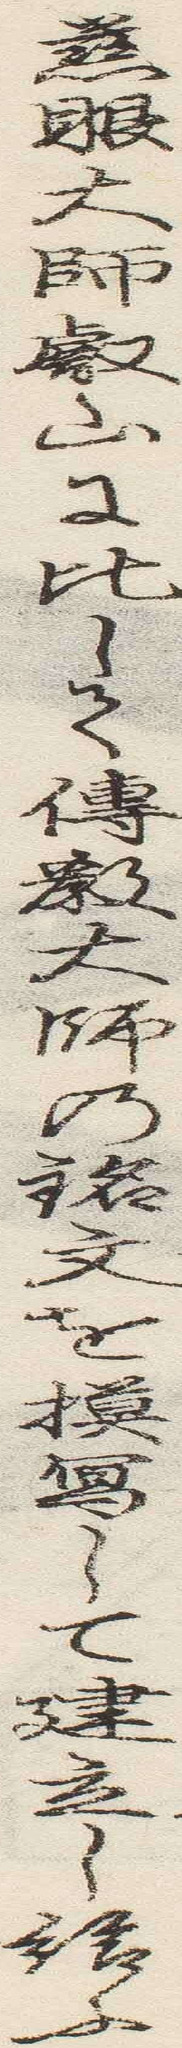慈眼大師叡山に比して傳敎大師の銘文を摸冩して建立し給ふ
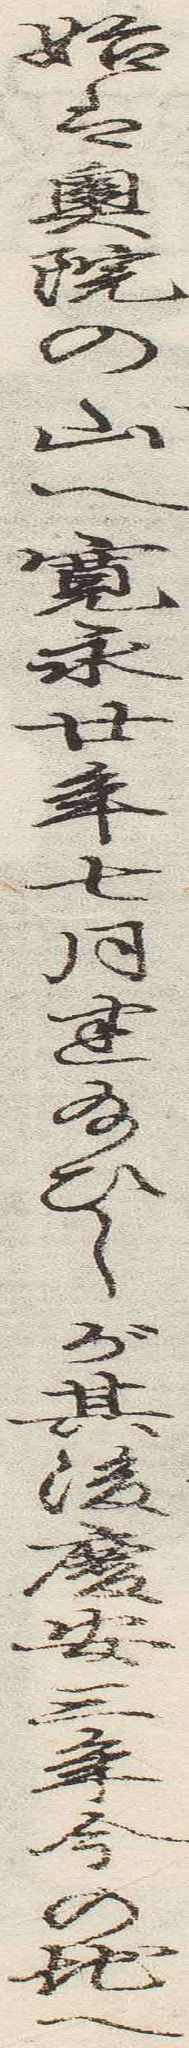始は奥院の山へ寛永廿年七月建給ひしが其後慶安三年今の地へ
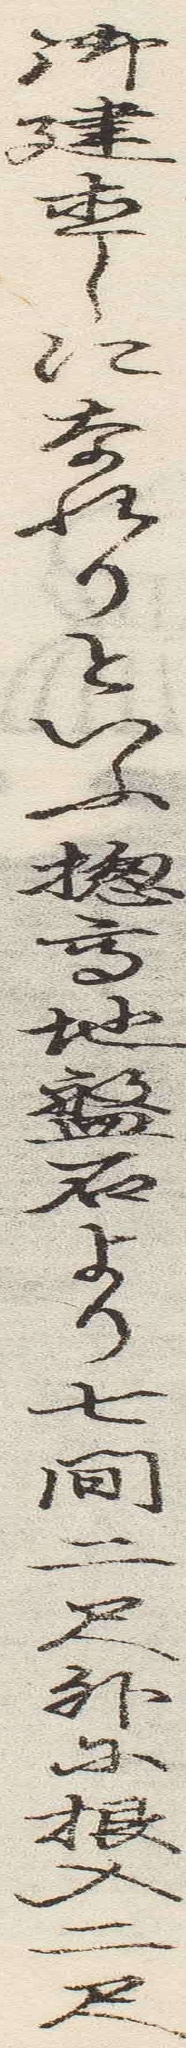御建直しになれりといふ揔高地盤石より七間二尺外に根入二尺
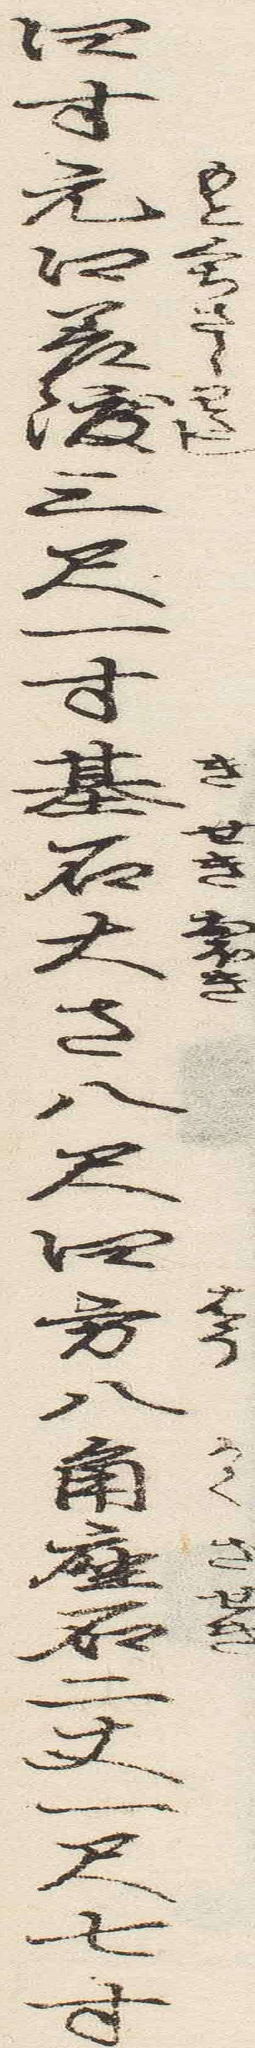四寸元口差渡三尺一寸基石大さ八尺四方八角座石二丈一尺七寸
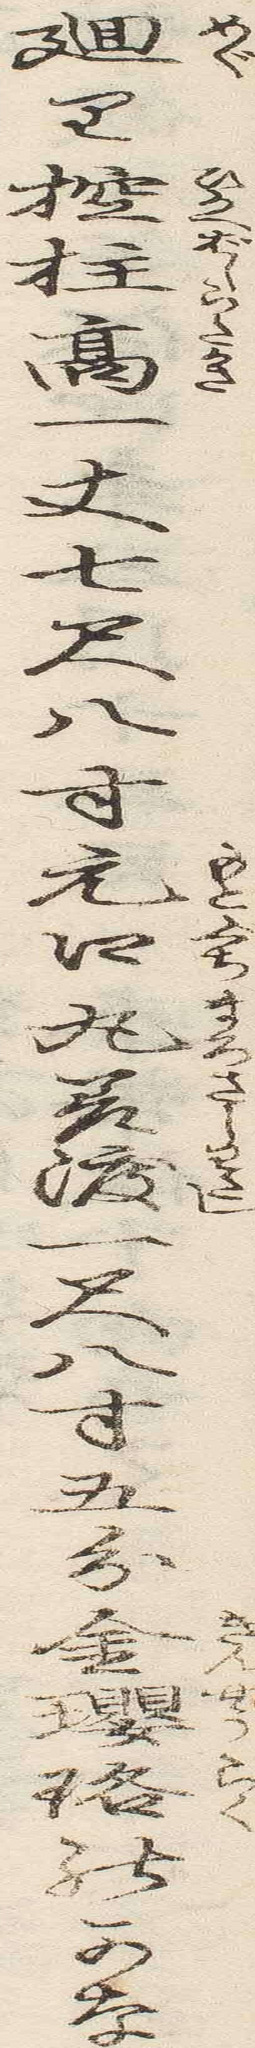廽り控柱髙一丈七尺八寸元口丸差渡一尺八寸五分金瓔珞のかな
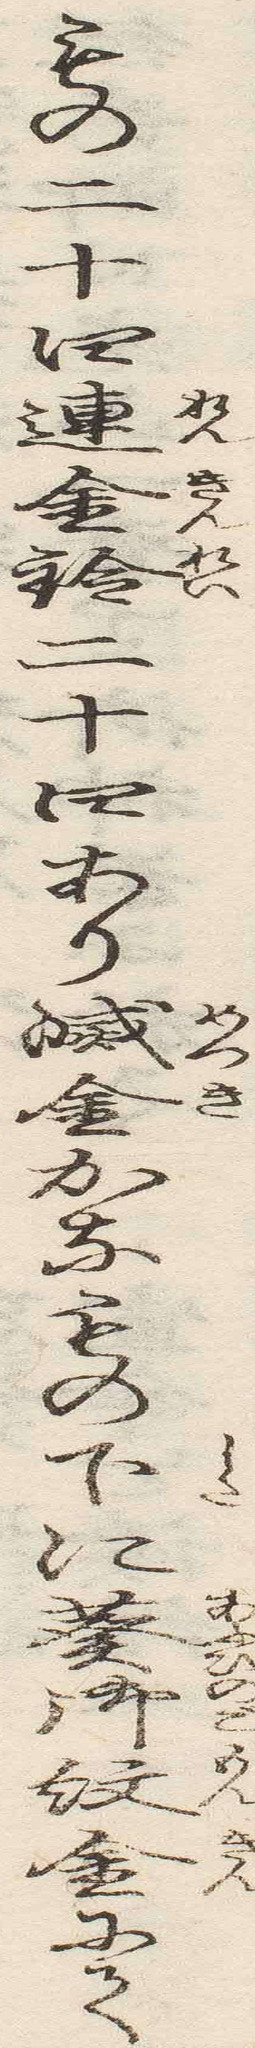もの二十四連金鈴二十四あり滅金かなもの下に葵御紋金にて
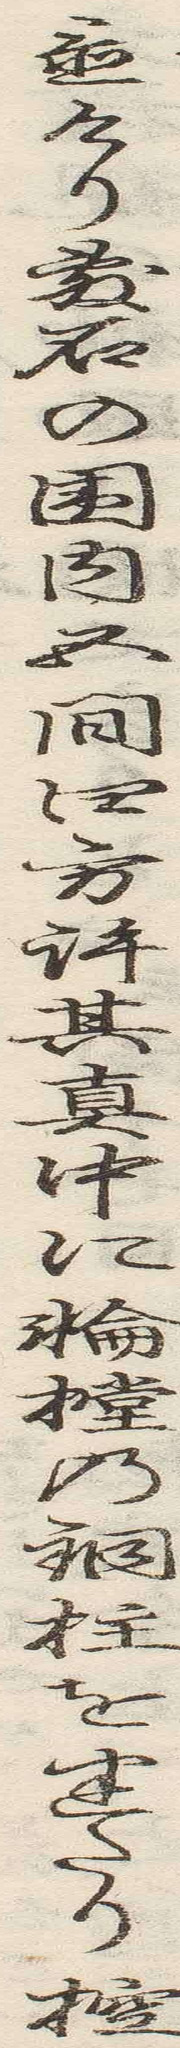置けり敷石の圍内五間四方許其真中に輪樘の銅柱を建たり控
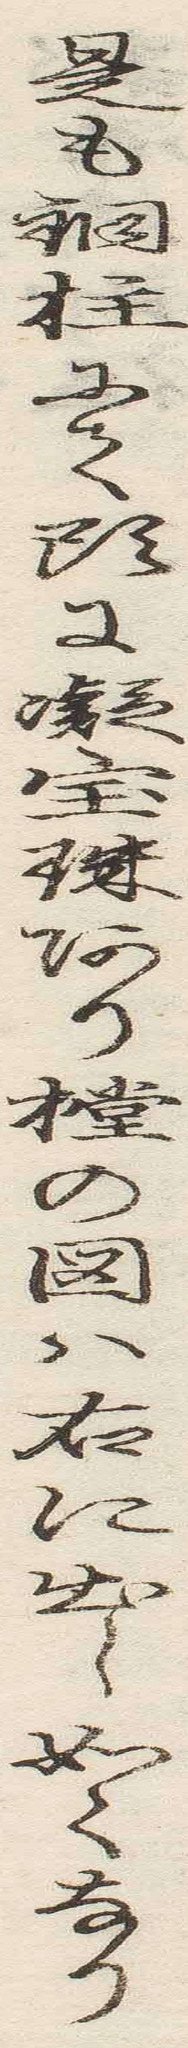是も銅柱にて頭に凝宝珠あり樘の図は右に出し如くなり
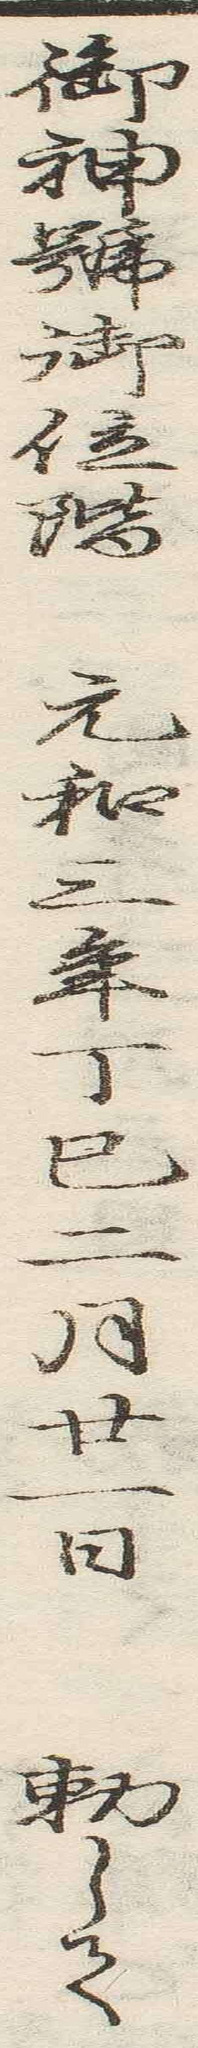御神號御位階元和三年丁巳二月廿一日勅して
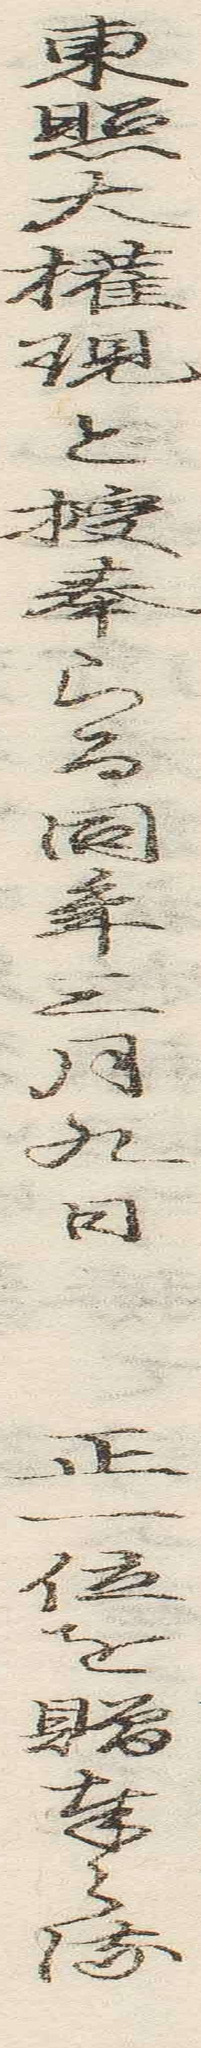東照大權現と授奉らる同年三月九日正一位を贈奉らる
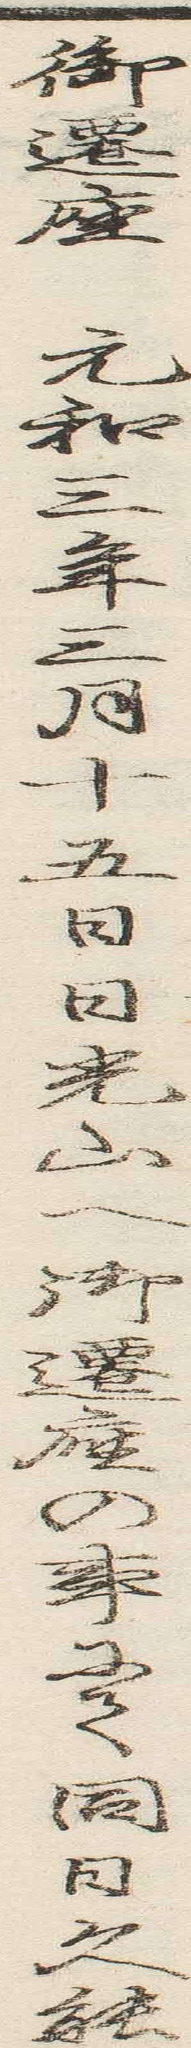御遷座元和三年三月十五日日光山へ御遷座の事にて同日久能
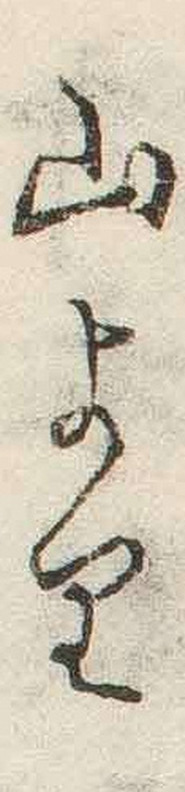山より
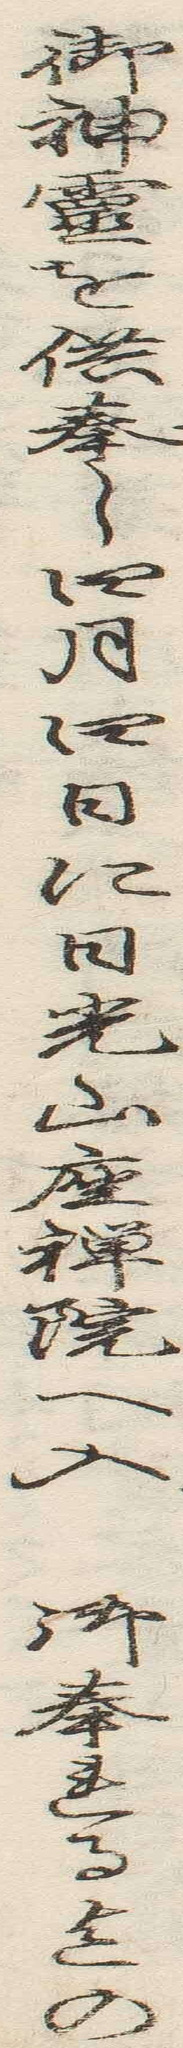御神靈を供奉し四月四日に日光山座禅院へ入御奉れる迄の
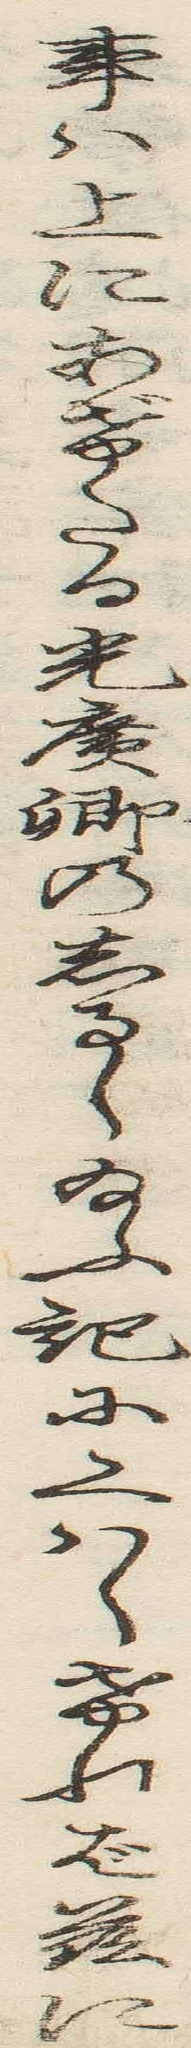事は上にあげたる光廣卿のしるし給ふ記にくはしければ兹に
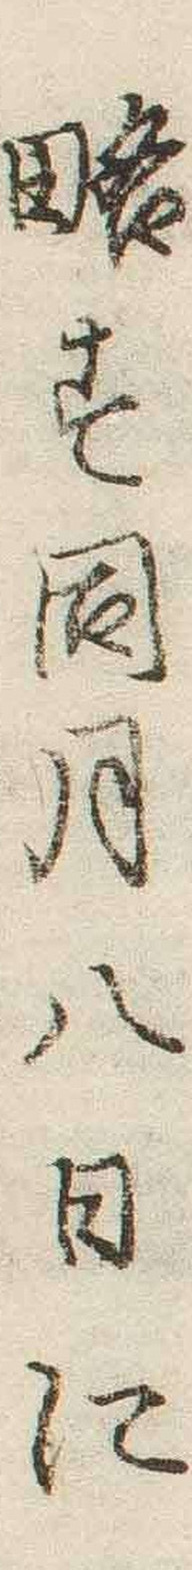略す同月八日に
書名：日光山志
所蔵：東京学芸大学附属図書館 国文学研究資料館
